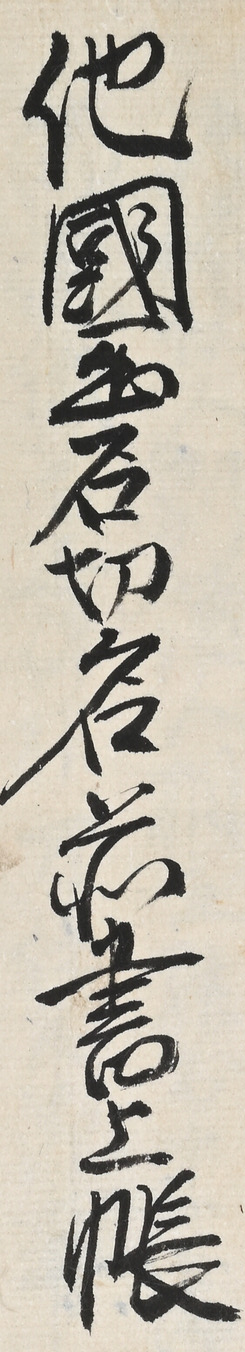他国出石切名前書上帳

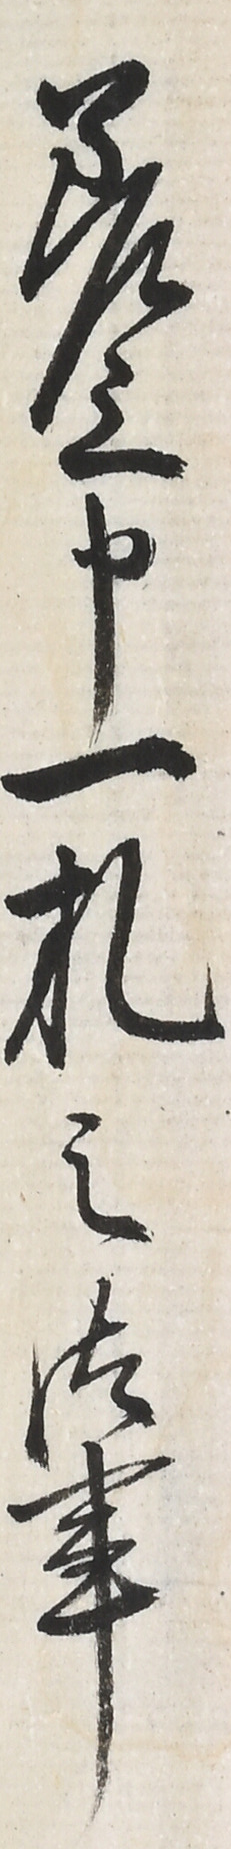差上申一札之御事
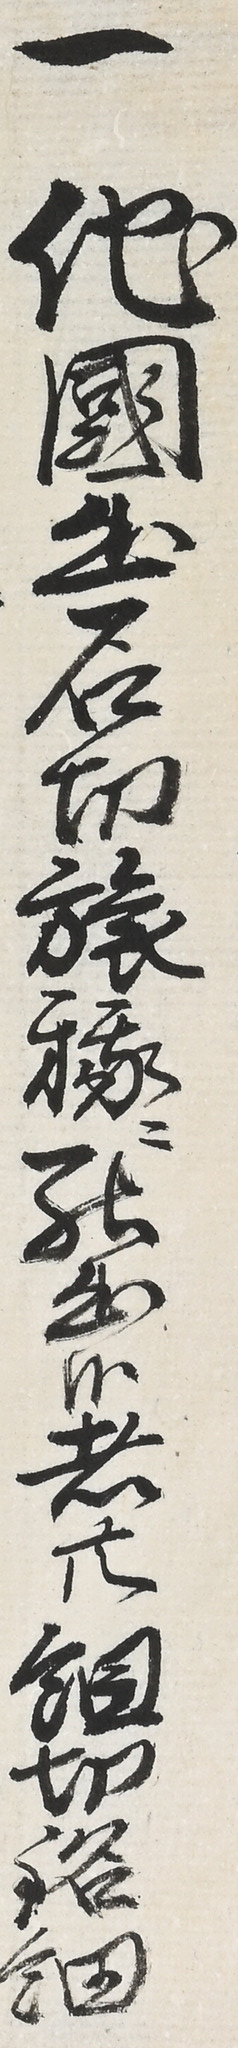一他国出石切旅稼ニ罷出候者共組切銘細
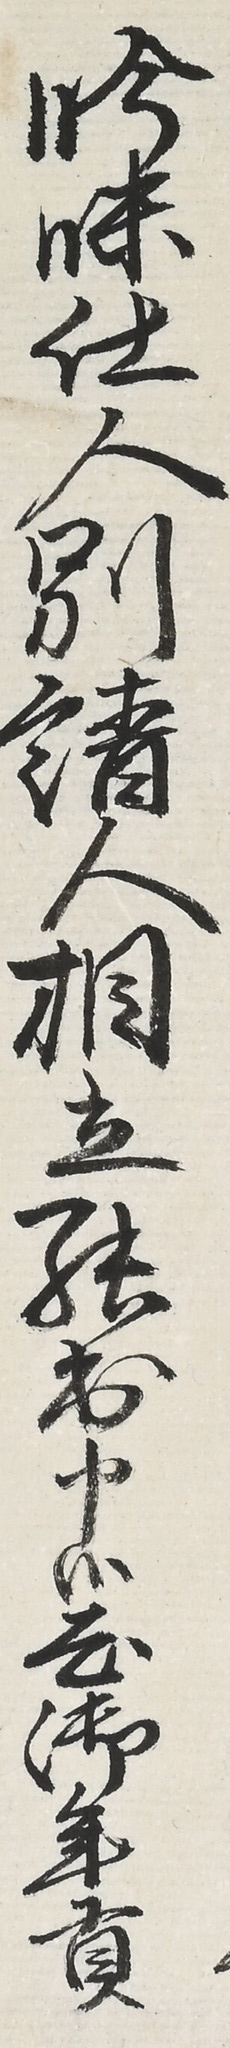吟味仕人別請人相立罷出申候尤御年貢
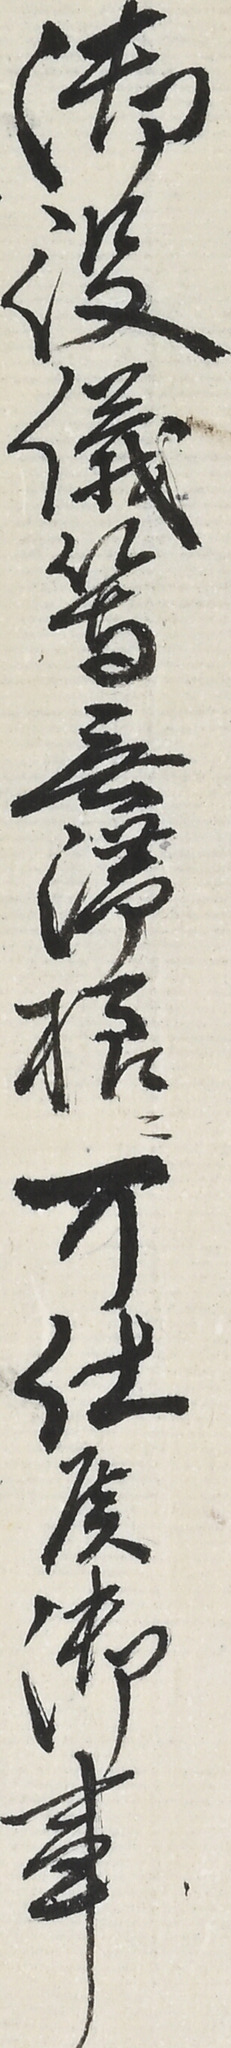御役儀等無滞様ニ可仕候御事
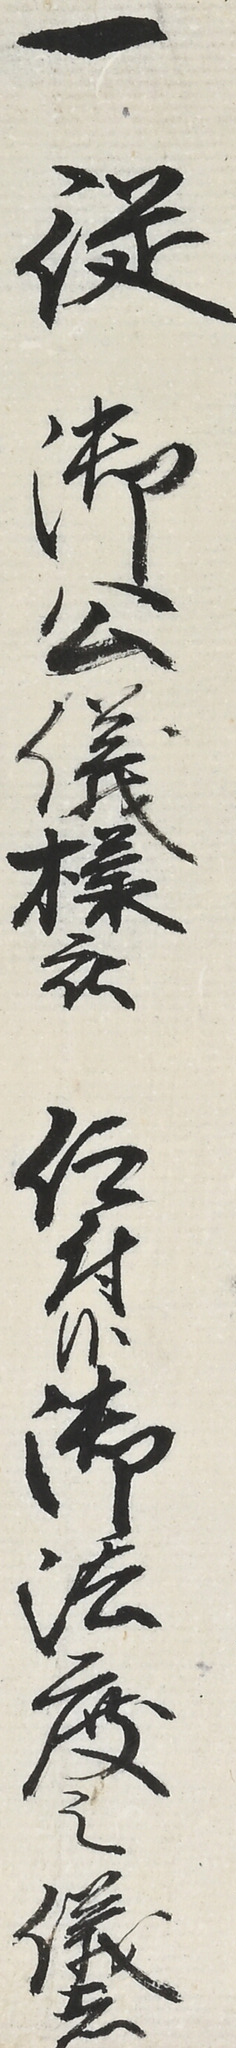一従御公儀様被仰付候御法度之儀者
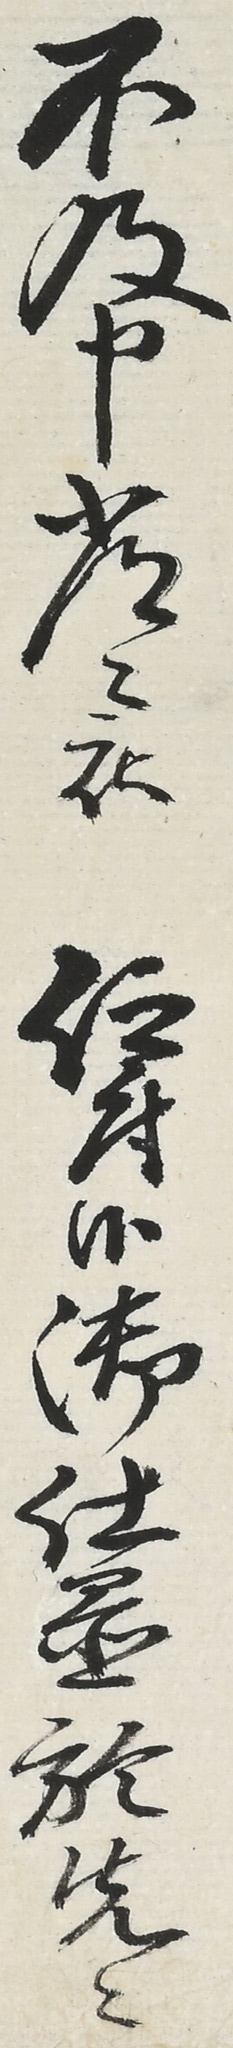不及申常々被仰付候御仕置於先々
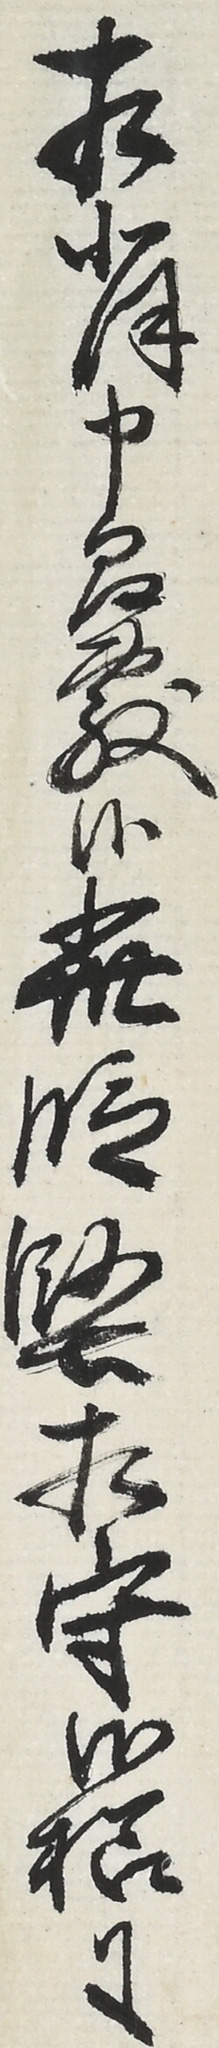相背申間敷候此段堅相守候様に

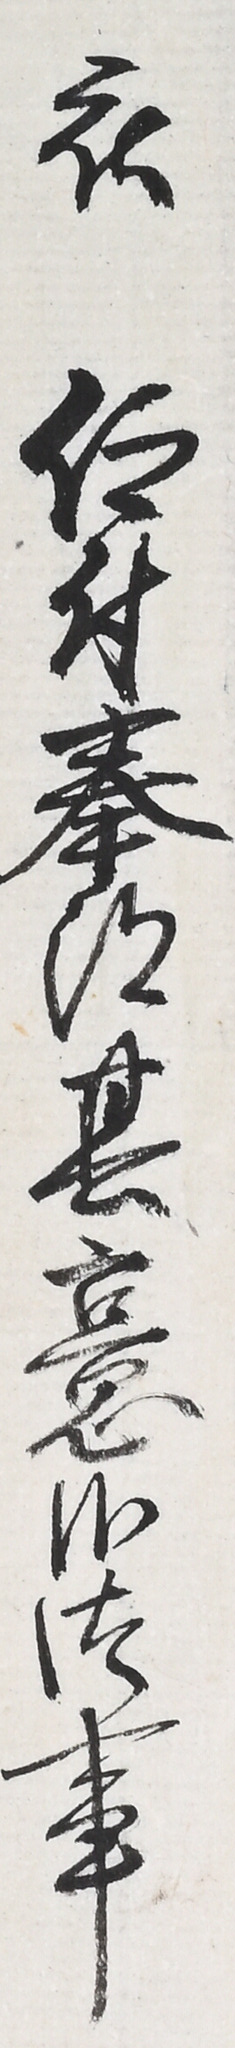被仰付奉得其意候御事
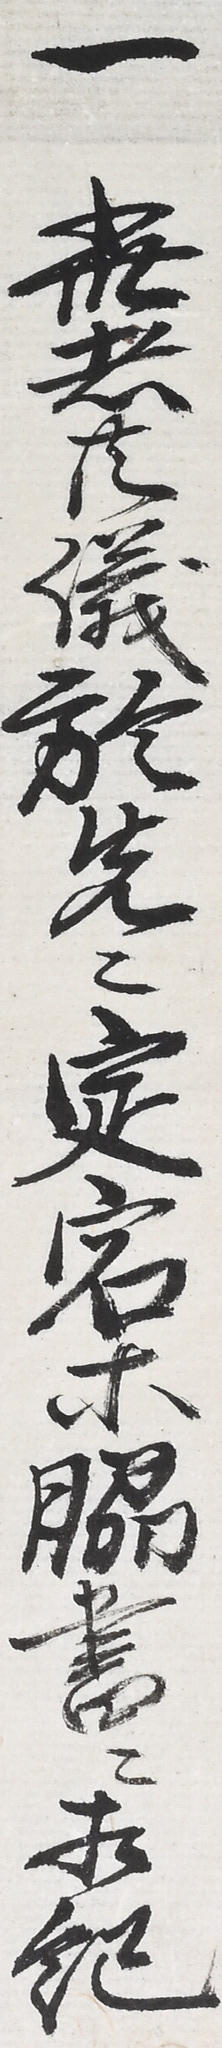一此者共儀於先々定宿等脇書ニ相記
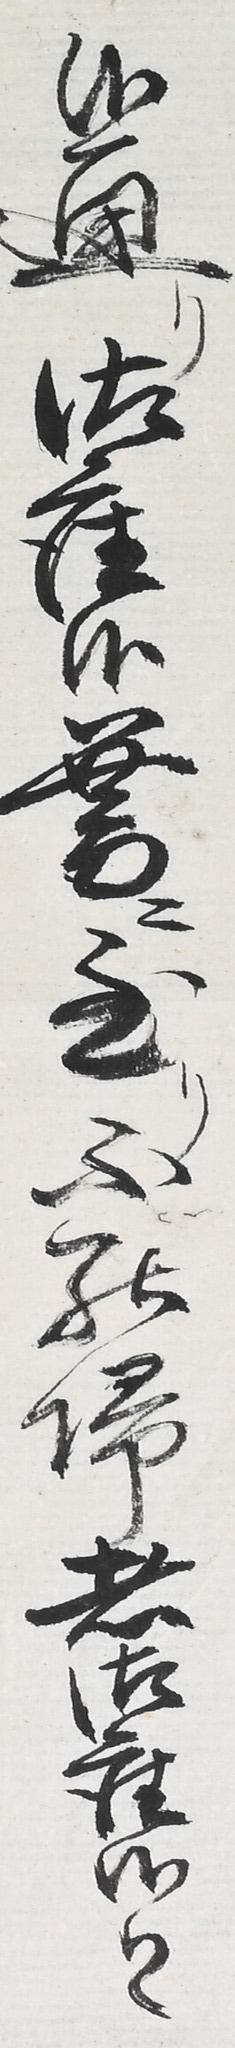候通リ御座候暮ニ至リ不罷帰者御座候ハヽ
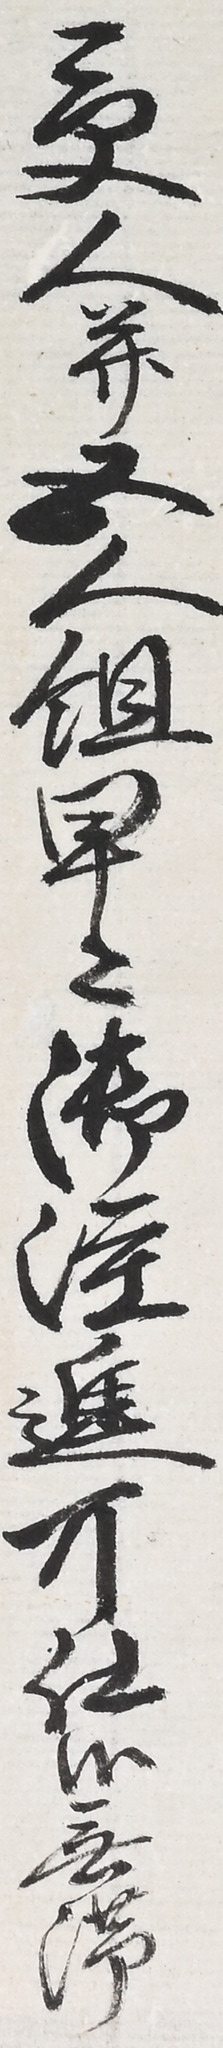受人并五人組早々御注進可仕候無滞
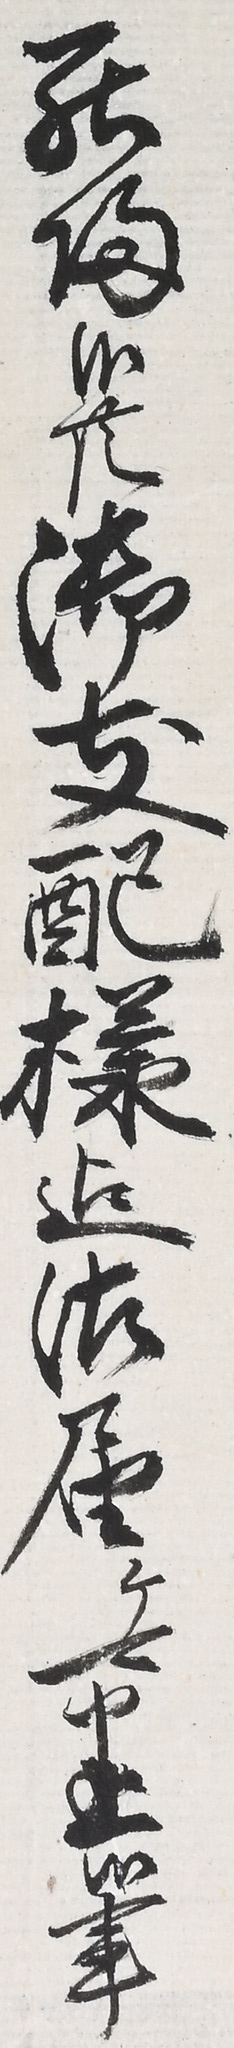罷帰候共御支配様迄御届ヶ可申上候事
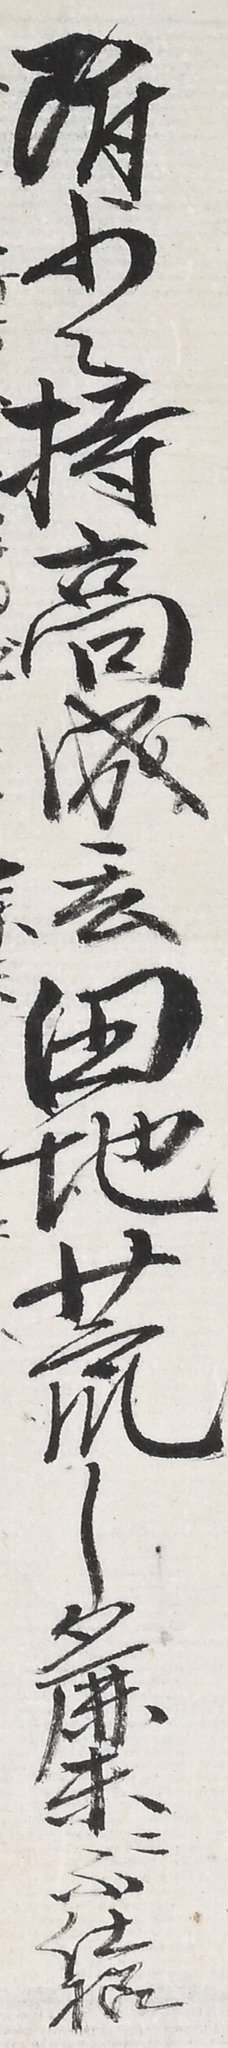附少々持高成共田地荒し麤末ニ不仕様
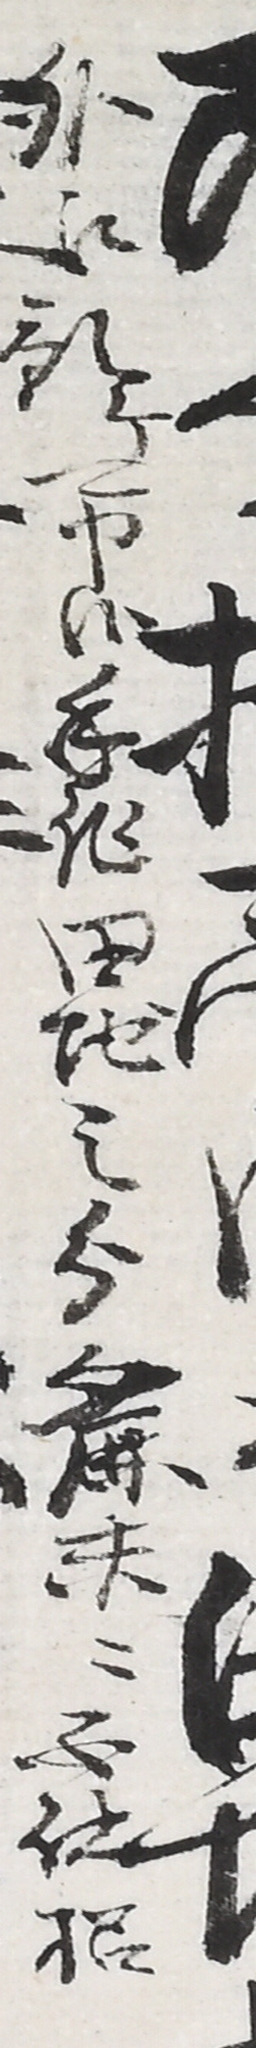外江預ヶ可申候手作田地之分麤末ニ不仕様
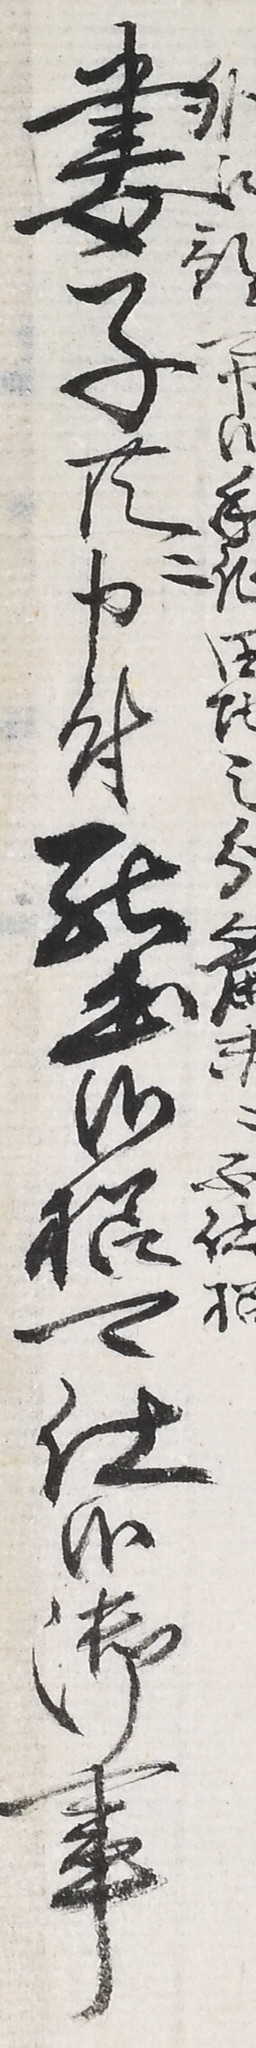妻子共ニ申付罷出候様可仕候御事
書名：弘化三丙午年正月他國出石切名前書上帳
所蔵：伊那市立高遠町図書館・合同会社AMANE
